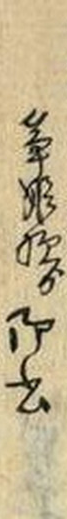箏姫様ゟ御書
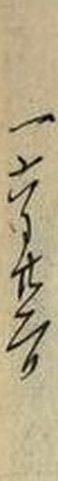一六月廿二日
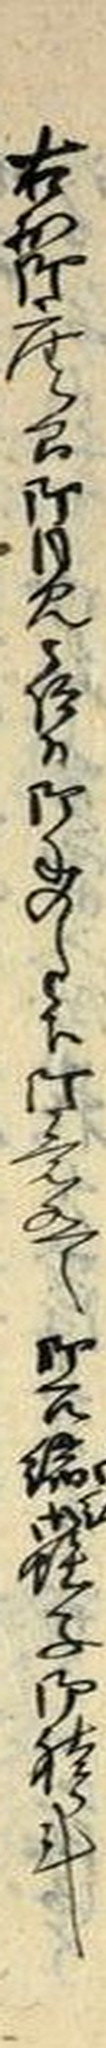右於御座之間御目見被仰付御手のし被下御意有之御召縮弐反御帷子御袴斗
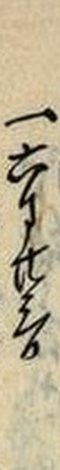一六月廿三日
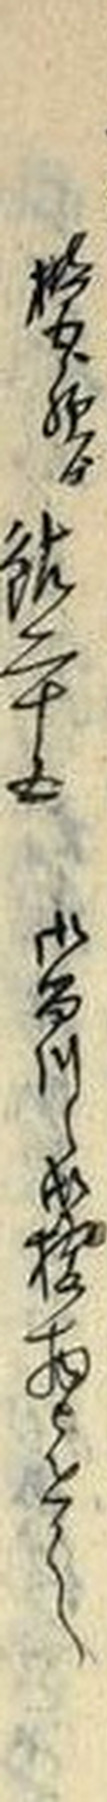揩五郎様ゟ鮎二十五御留川御獲物被進之
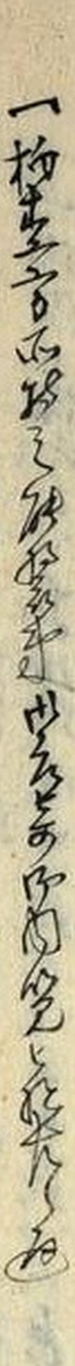一狛杢方所持之能装束御取寄御内覧被遊左之通
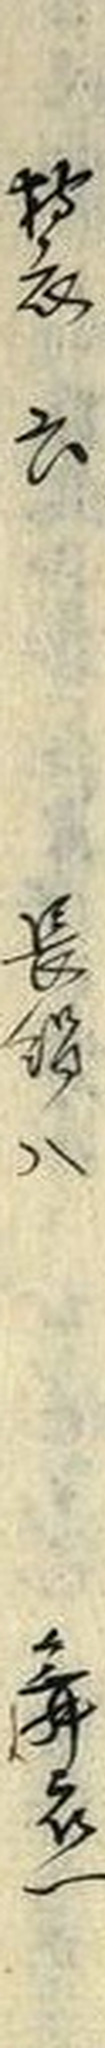狩衣六長絹八舞衣一
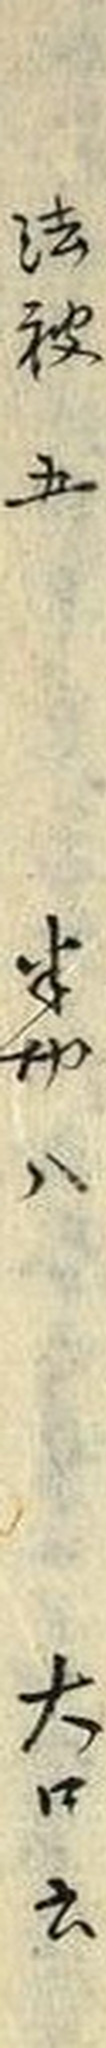法被五半切八大口六
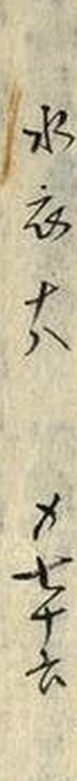水衣十八〆七十六
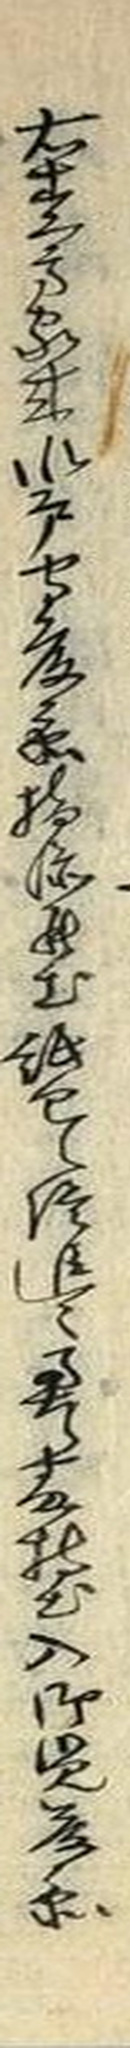右杢方家来水戸守藤兵衛指添罷出紙包之儘追々奥之番持出入御覧藤兵衛
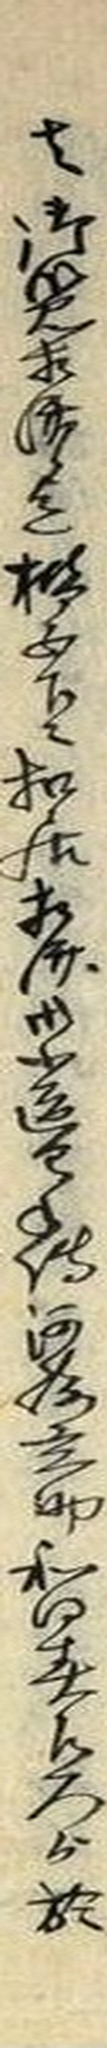は御覧相済迄楷子下ニ扣居相済御小道具手伝河嶋玄助和田春左衛門ゟ於
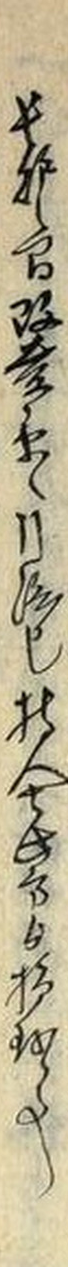長炉之間改藤兵衛へ引渡申候持人は此方ゟ指越候事
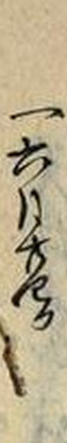一六月廿四日

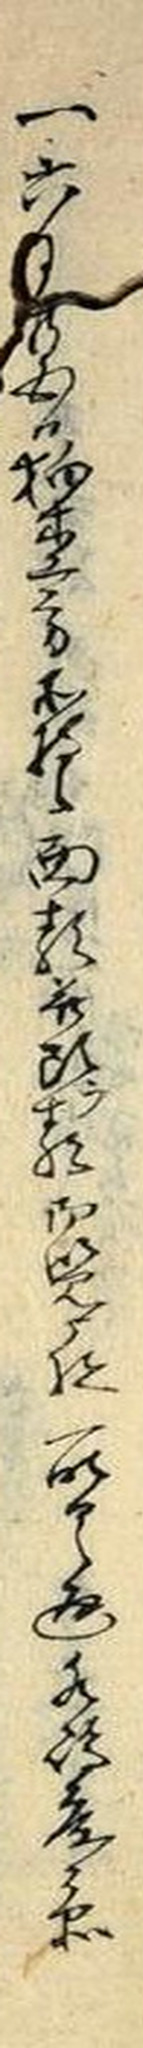一六月廿五日狛杢方所持之面類并頭類御覧被遊一昨日之通水嶋藤兵衛
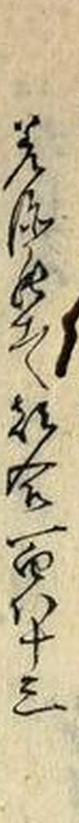差添罷出之都合百八十三
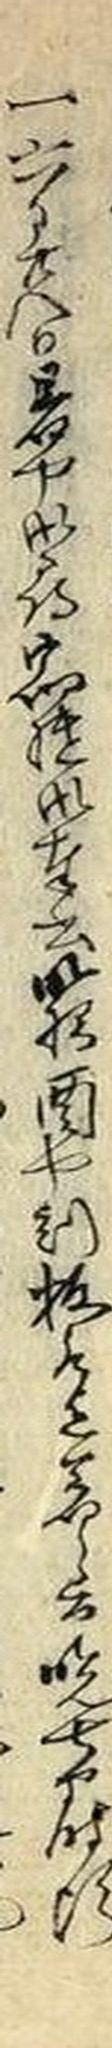一六月廿八日暑中御尋宿継御奉書此程酉中刻板取迄着候旨暁七半時頃
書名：少傅日録抄（斉承付側向頭取日記、在国）
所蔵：福井県文書館 Fukui Prefectural Archives
